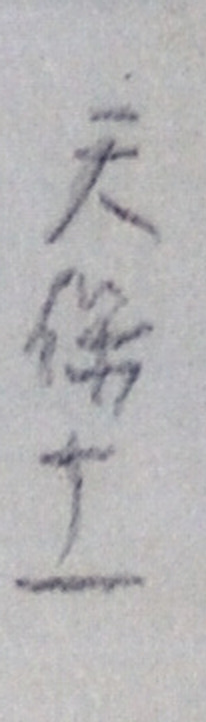天保十一
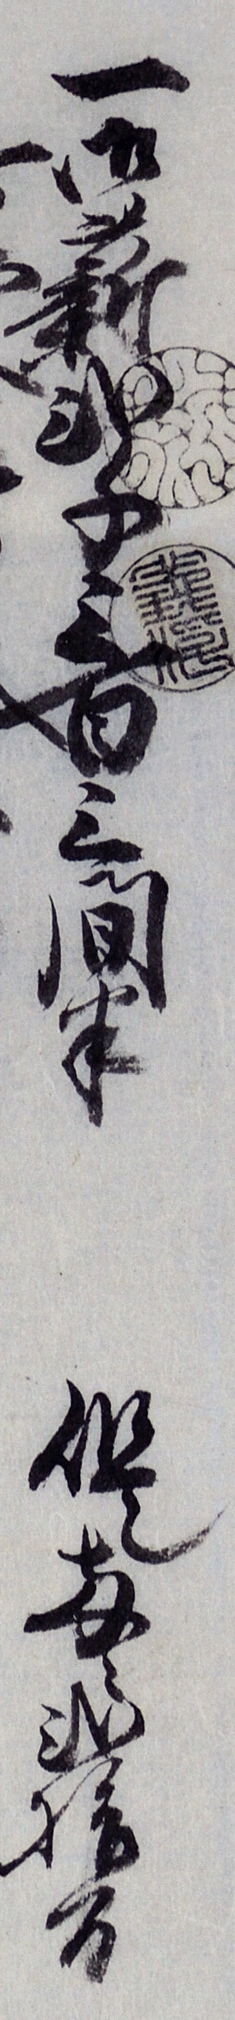一御薪弐千三百三間半但シ両ニ弍拾間
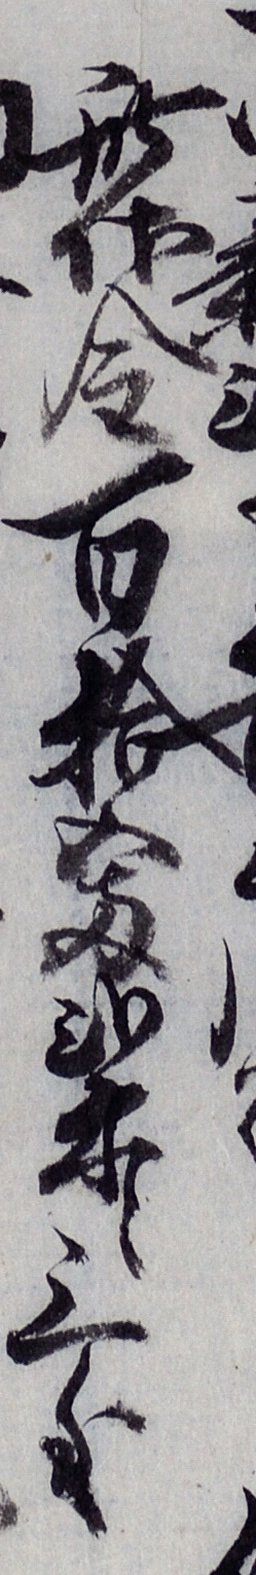此代金百拾五両弐朱と三匁
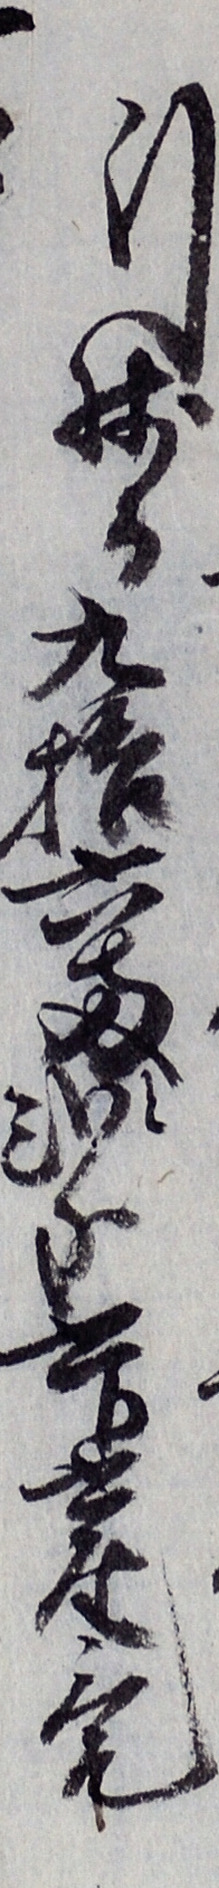引残而九拾六両と弐匁六分六厘三毛
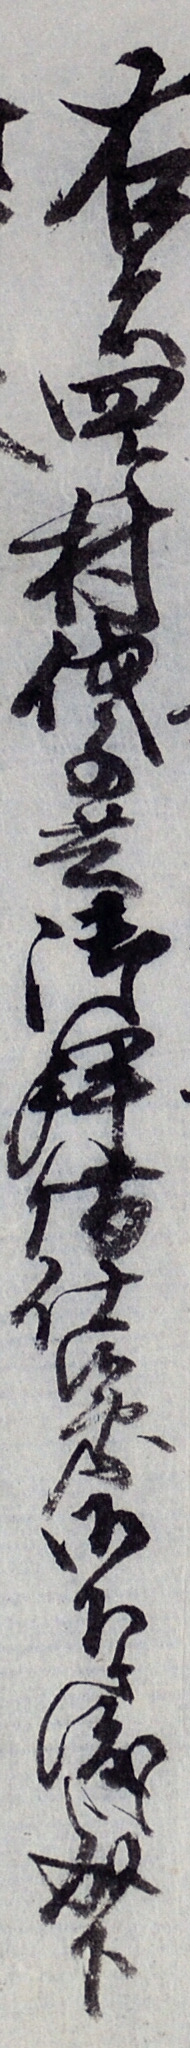右者四ケ村伐子共御拝借仕候処、御下ケ渡し被成下
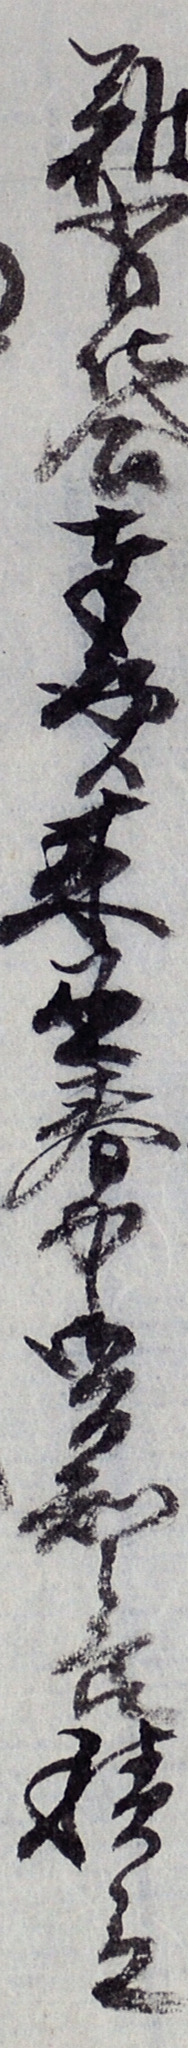難有仕合奉存候来丑春中御召知之節積立
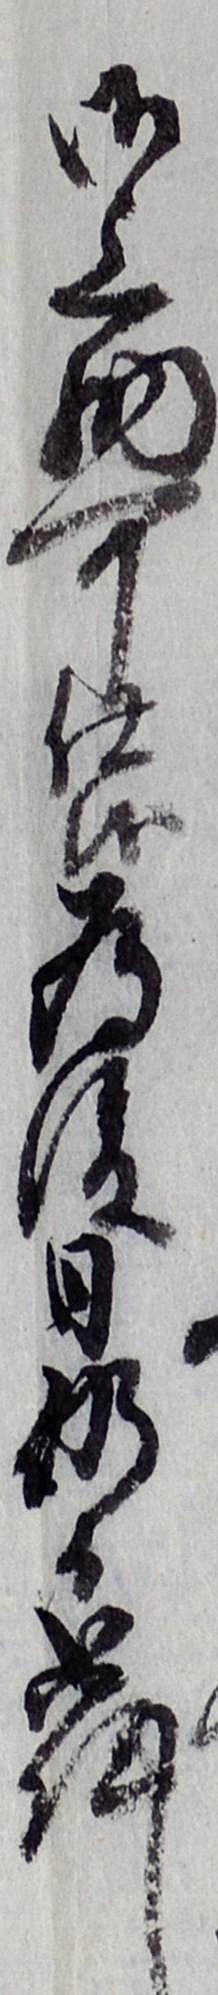御上納可仕候為後日仍而如件
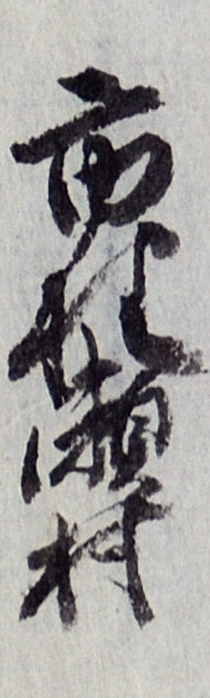市野瀬村
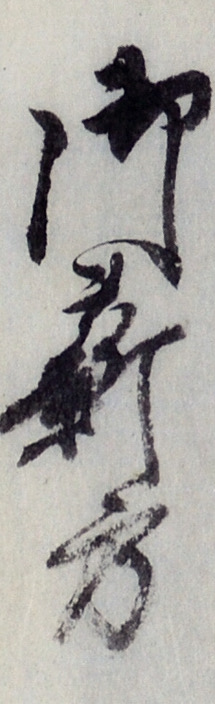御薪方
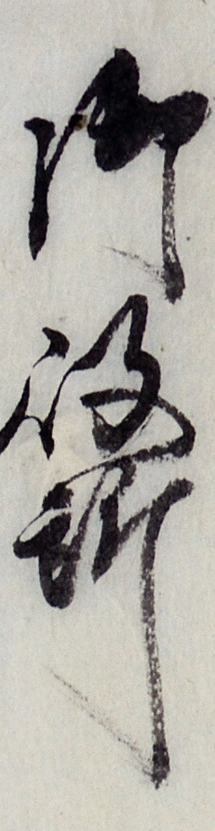御役所

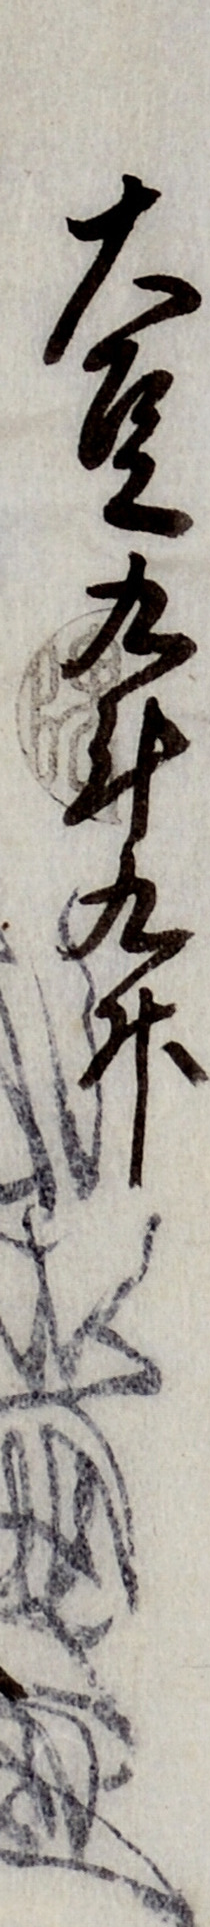大豆九斗九升
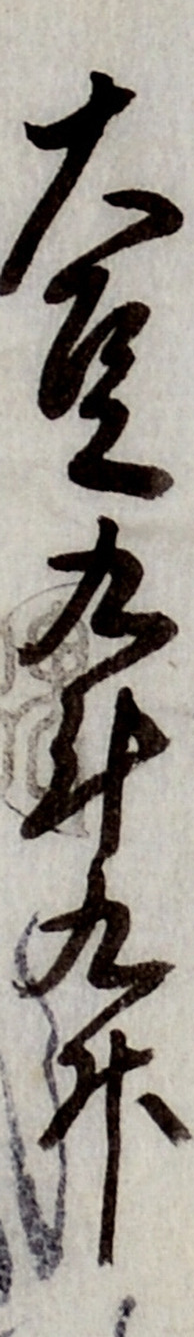大豆九斗九升
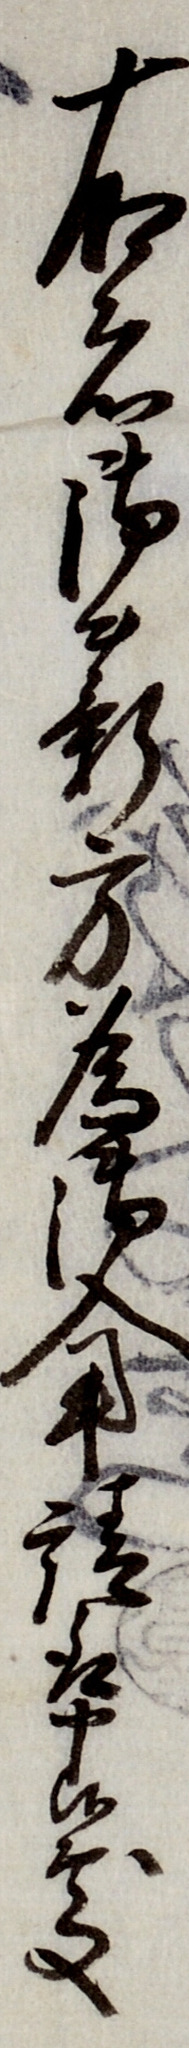右者御薪方為御入用請取申候処
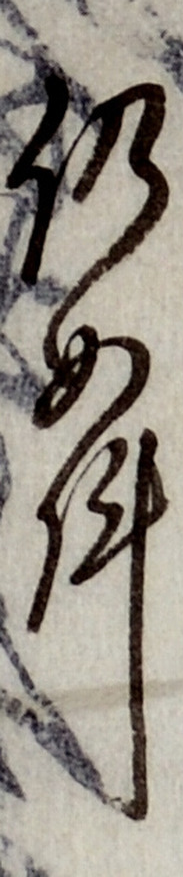仍如件
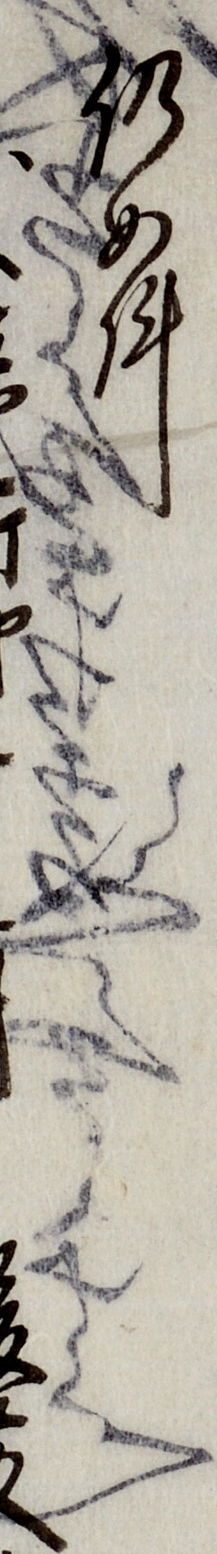仍如件
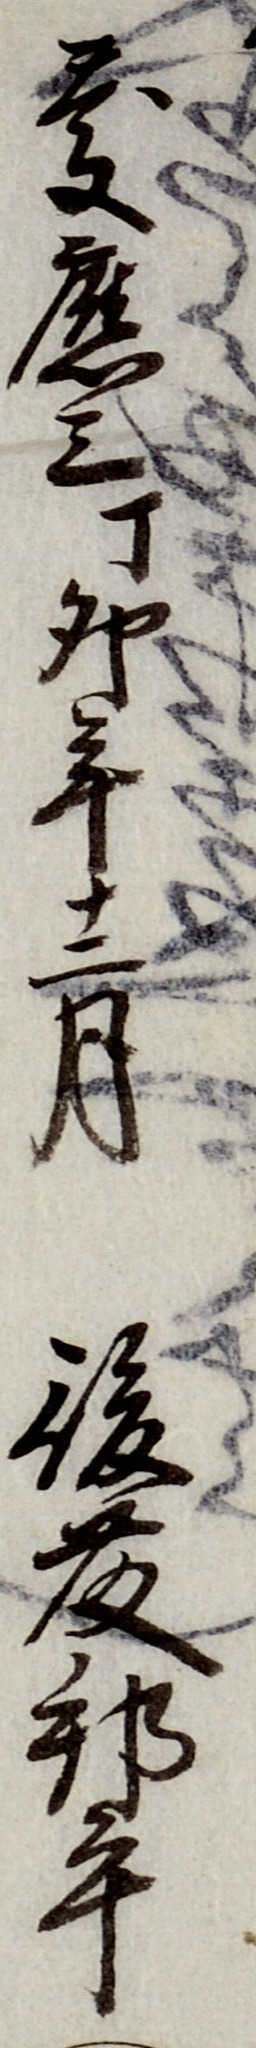慶応三丁卯年十二月後藤邦平㊞
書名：覚
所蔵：伊那市立高遠町図書館・合同会社AMANE
